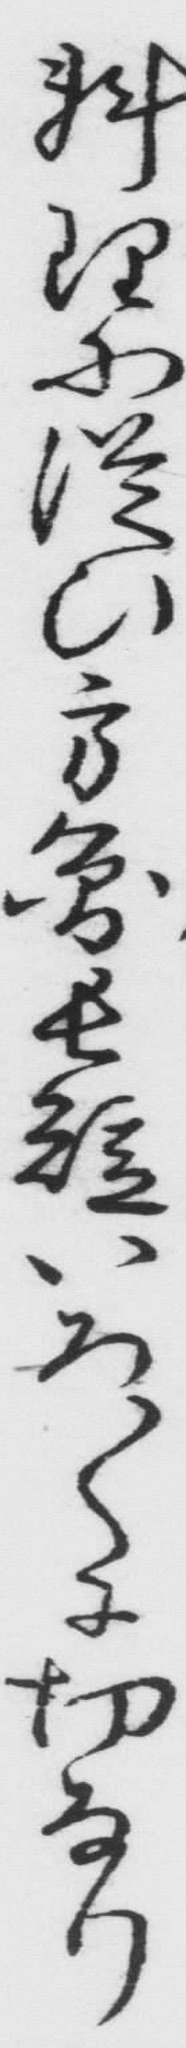料理に従ひ方圓長短いろ〳〵に切なり
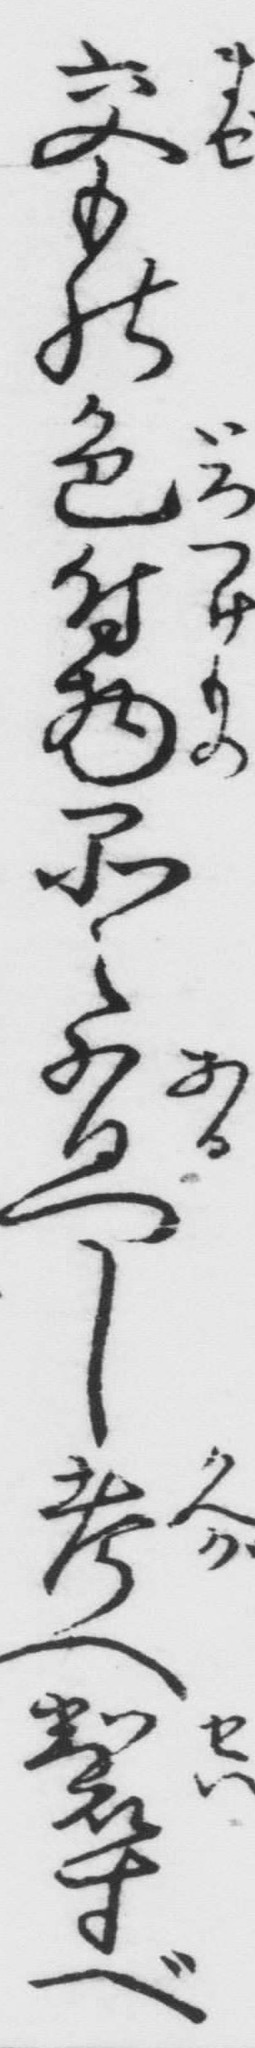交もの色付物品々有へし考へ製すべ
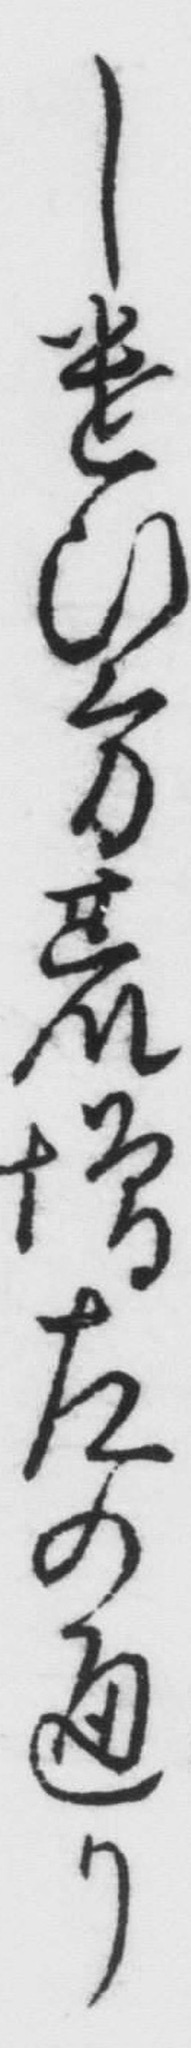し遣ひ方荒増左の通り

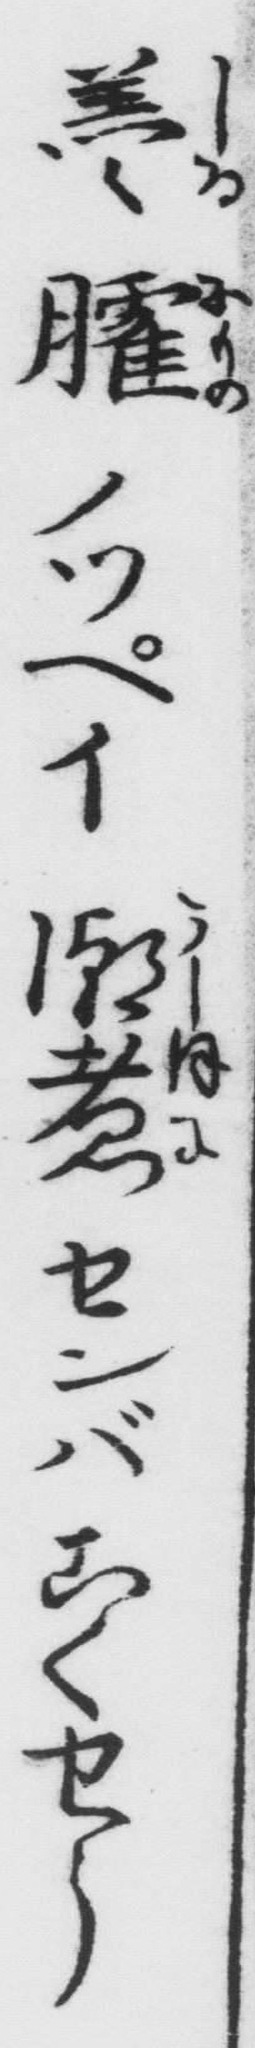羹臛ノツペイ潮煮センバこくせう
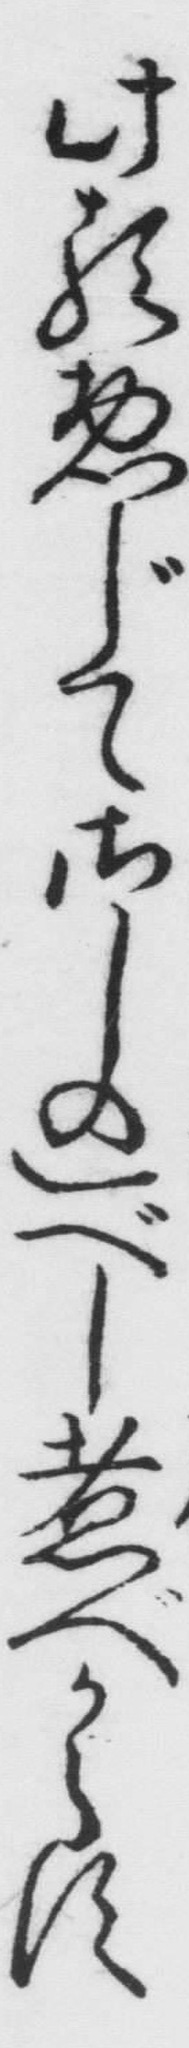此類惣じてさし込べし煮べからす
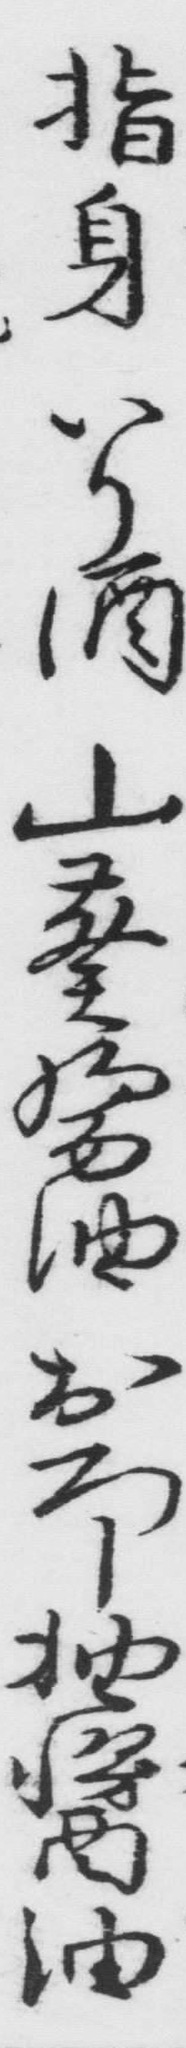指身いり酒山葵醤油おろし柚醤油
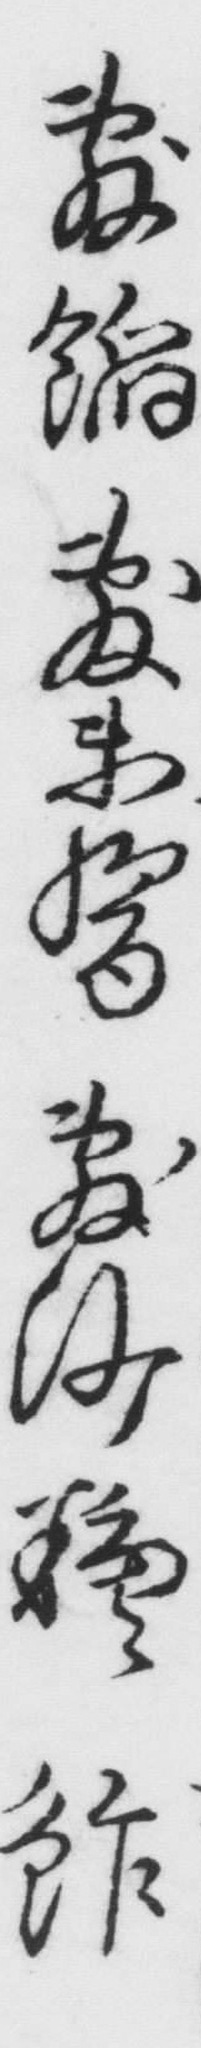敷餡敷未醤敷沙糖鮓
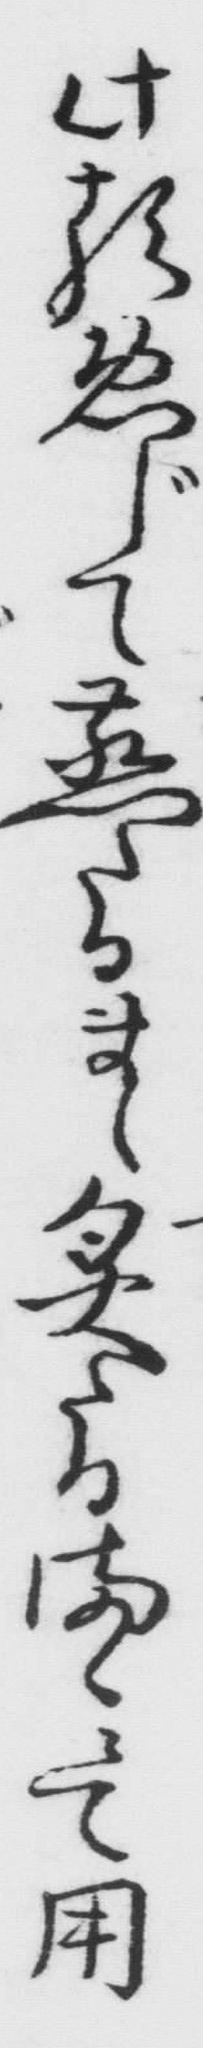此類惣じて蒸たるまゝ炙たるまゝにて用
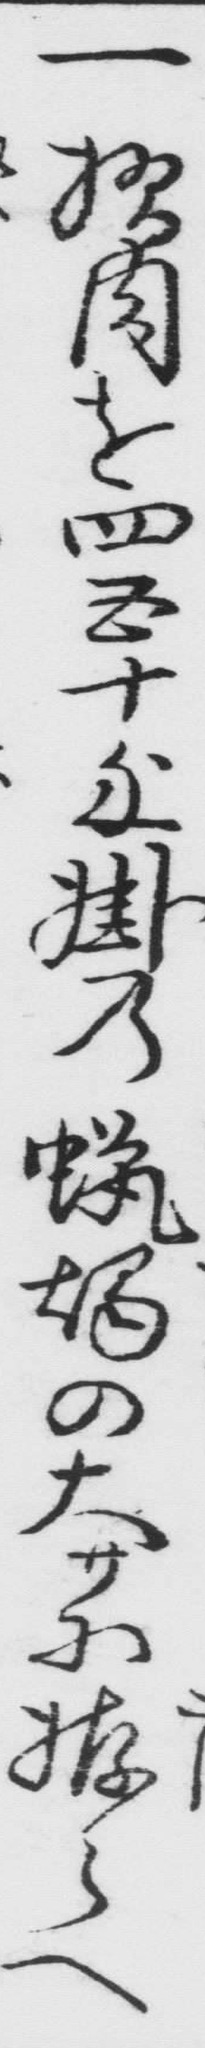一摺肉を四五十匁掛の蠟燭の大さに拵らへ
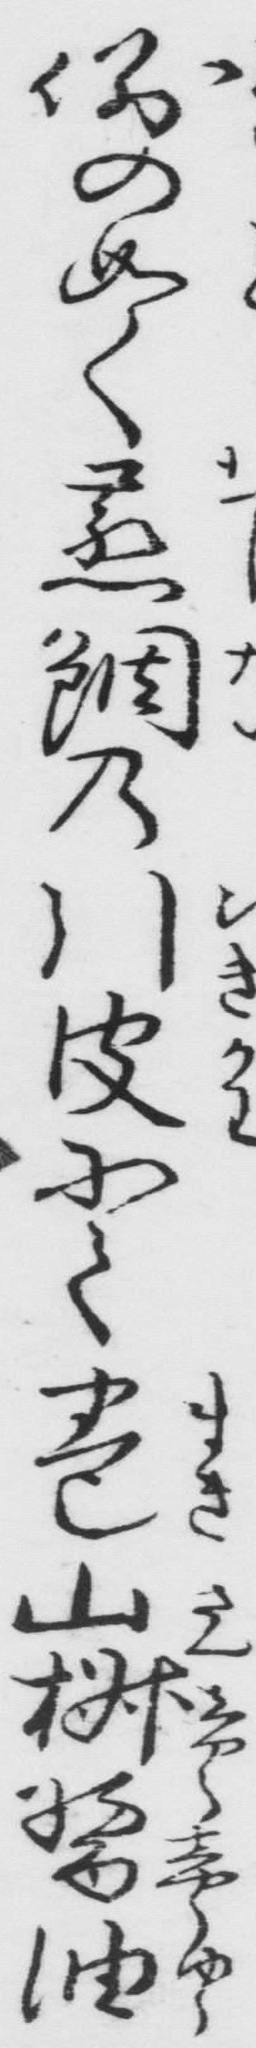例の如く蒸鯛の引皮にて巻山椒醤油
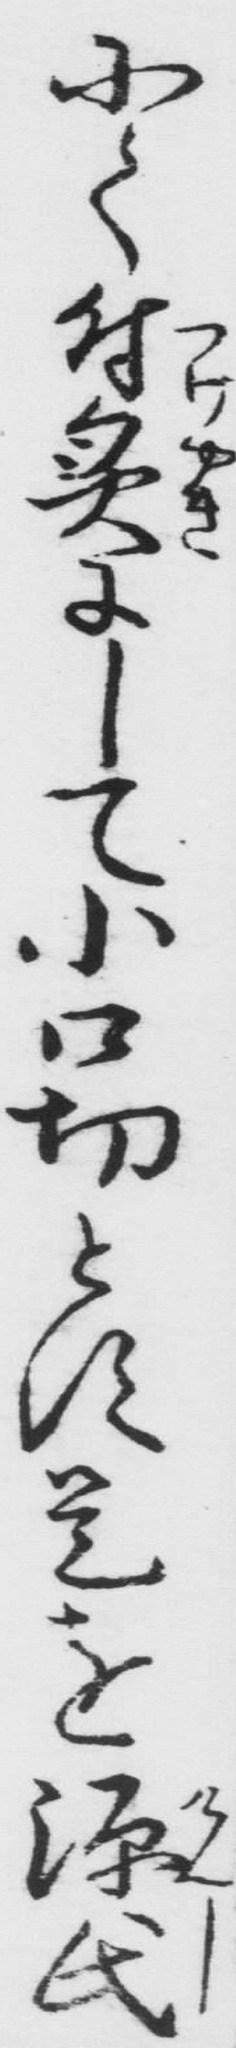にて付炙にして小口切とす是を源氏
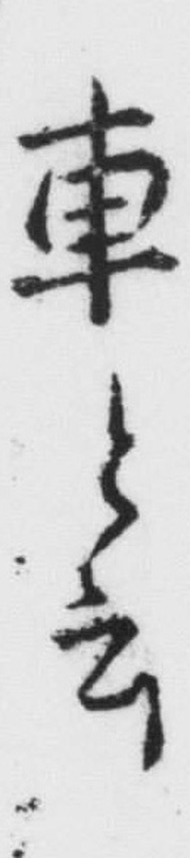車と云
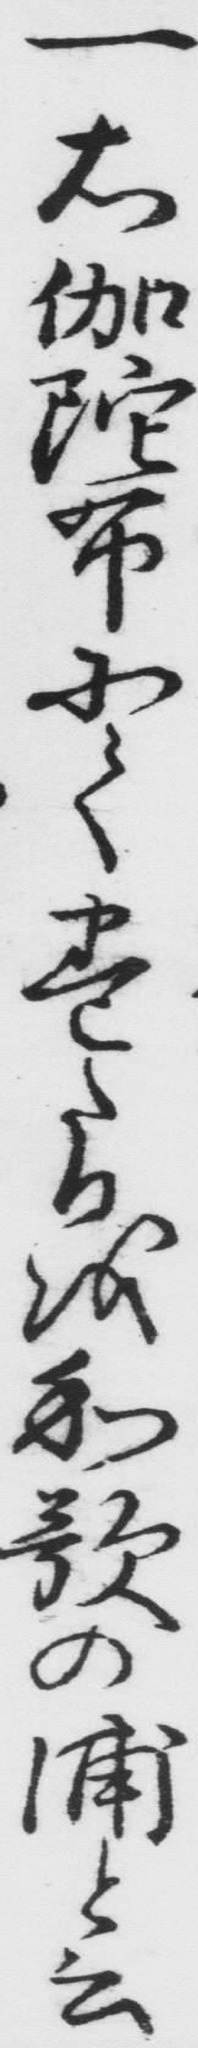一右伽陀布にて巻たるを和歌の浦と云
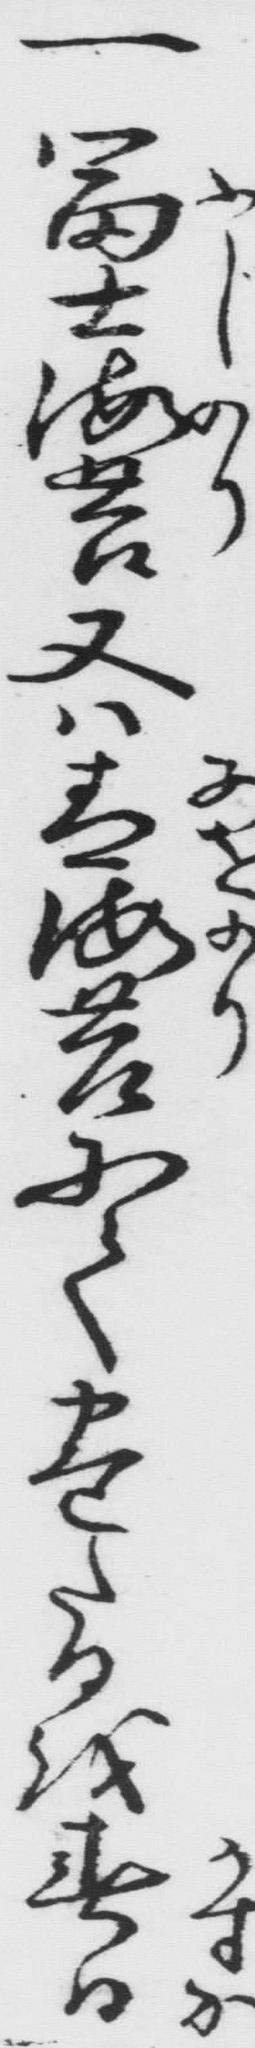一冨士海苔又は青海苔にて巻たるを春日
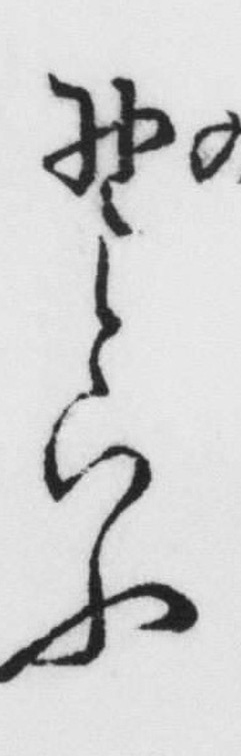野といふ
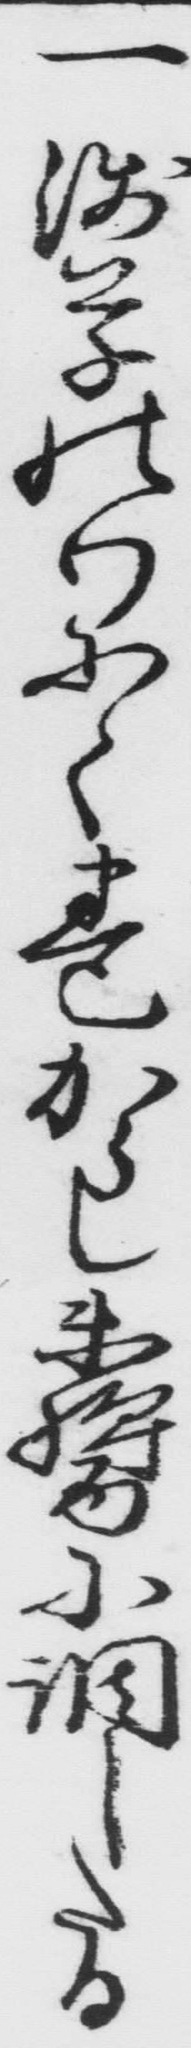一浅草のりにて巻からし未醤に調したる
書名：海鰻百珍
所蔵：大阪府立大学学術情報センター 国文学研究資料館
